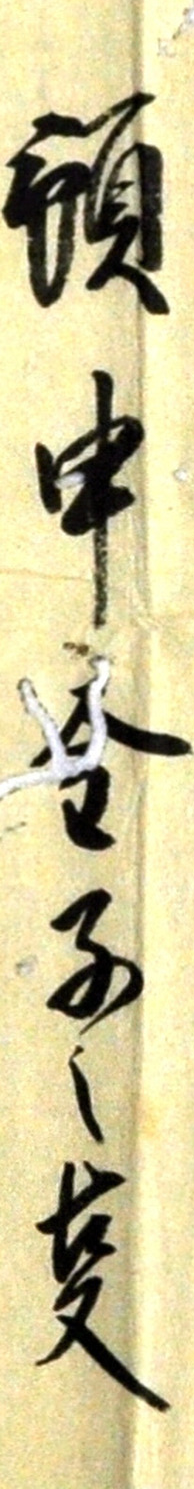預申金子之事
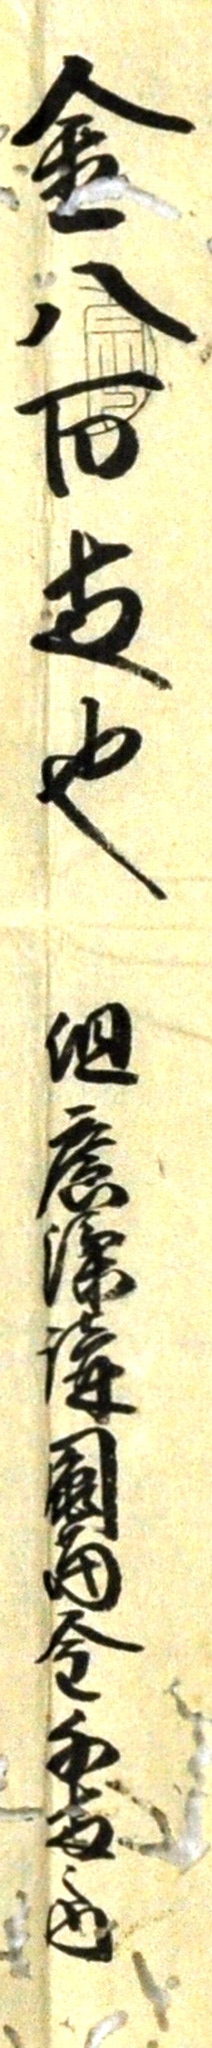金八百両也但、広沢講鬮当金千両之内
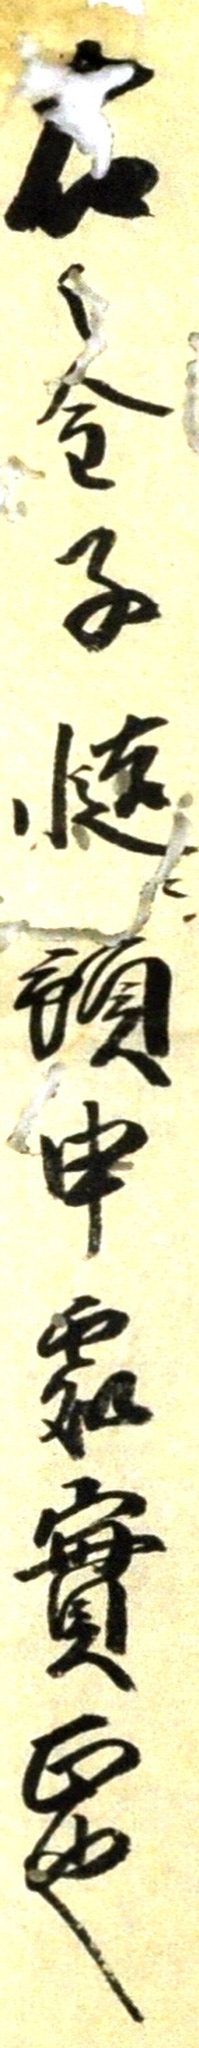右之金子、慥ニ預申処実正也、
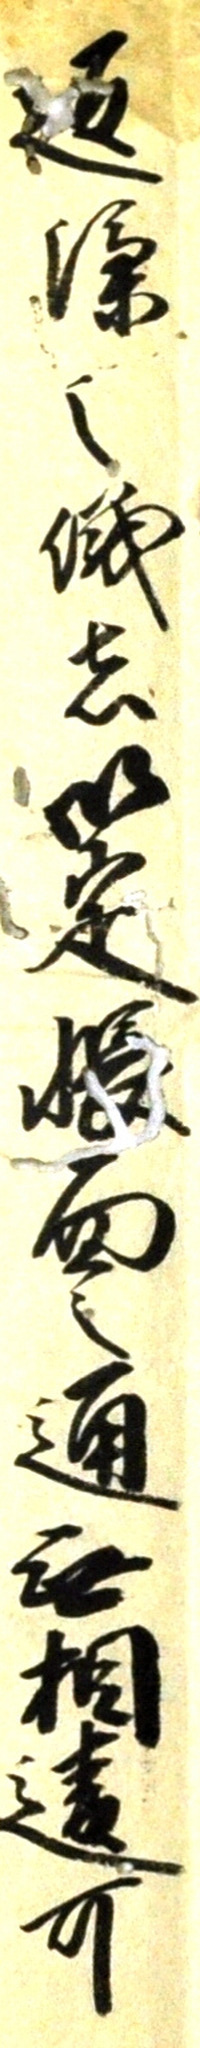返済之儀者、御定帳面之通、無相違可
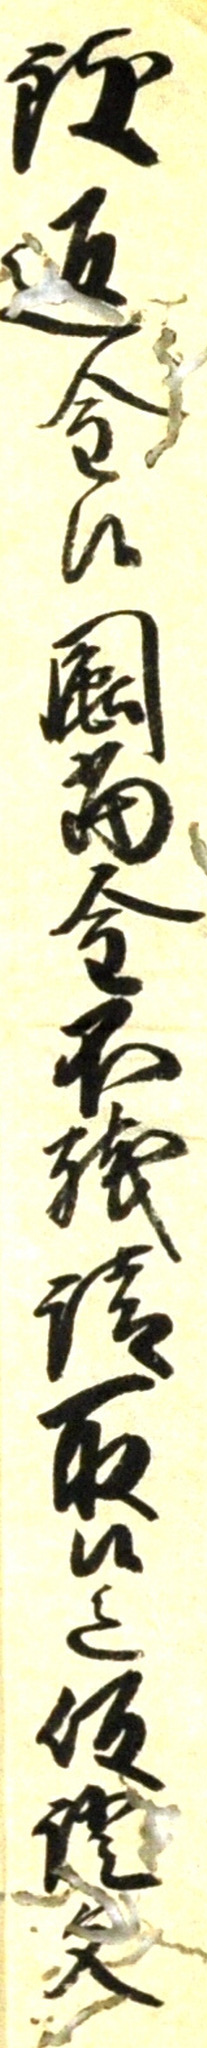致返金候、鬮当金不残請取候迄、仮証文
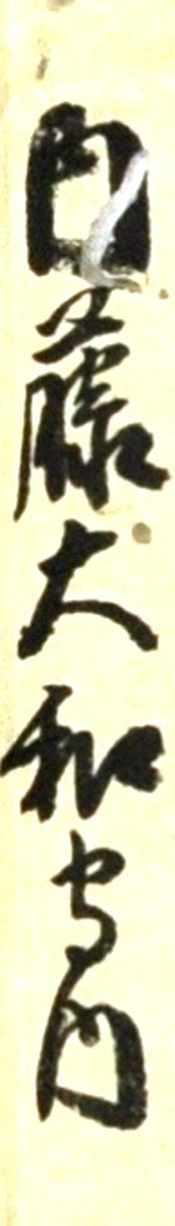内藤大和守内
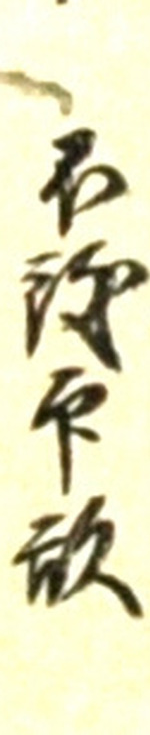不致印形
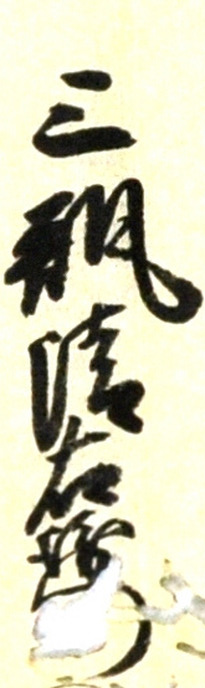三瓶清右衞門
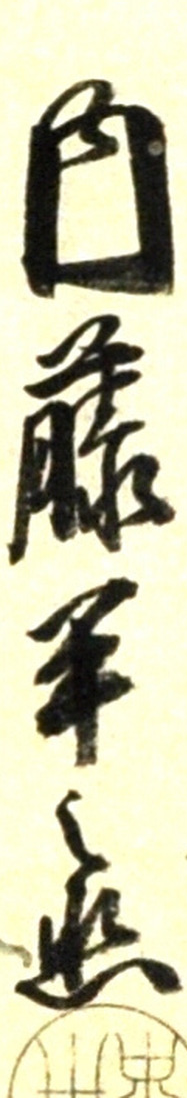内藤半之丞
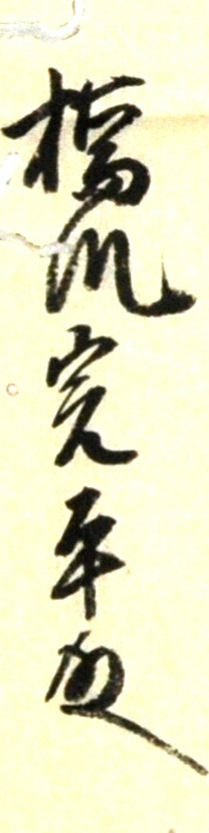橋爪完平殿

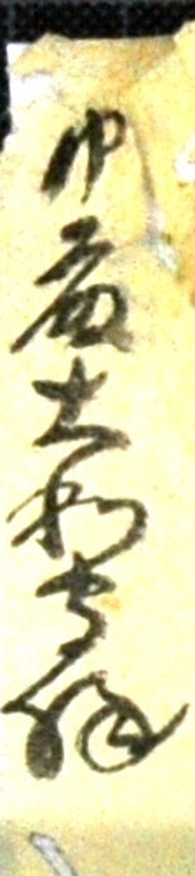内藤大和守様
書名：預り申金子之事
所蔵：伊那市立高遠町図書館・合同会社AMANE
